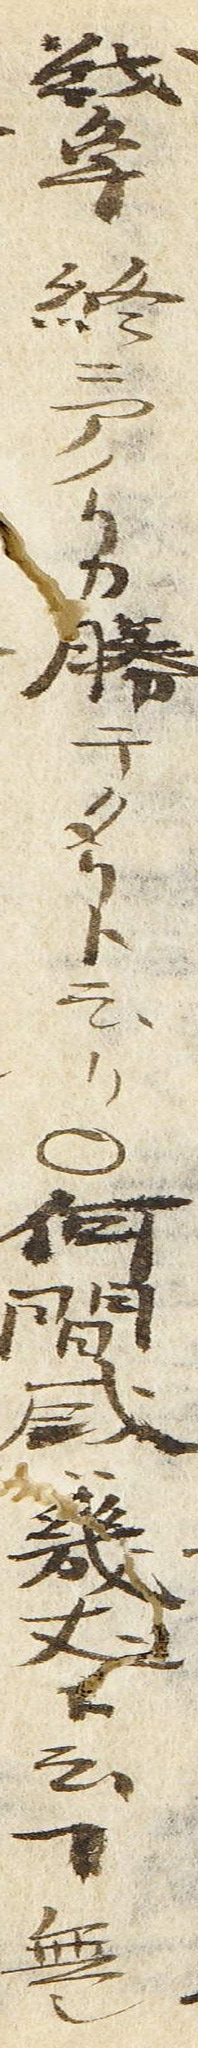戦争終ニアメリカ勝チタリト云リ〇何間或ハ幾丈ト云事無シ
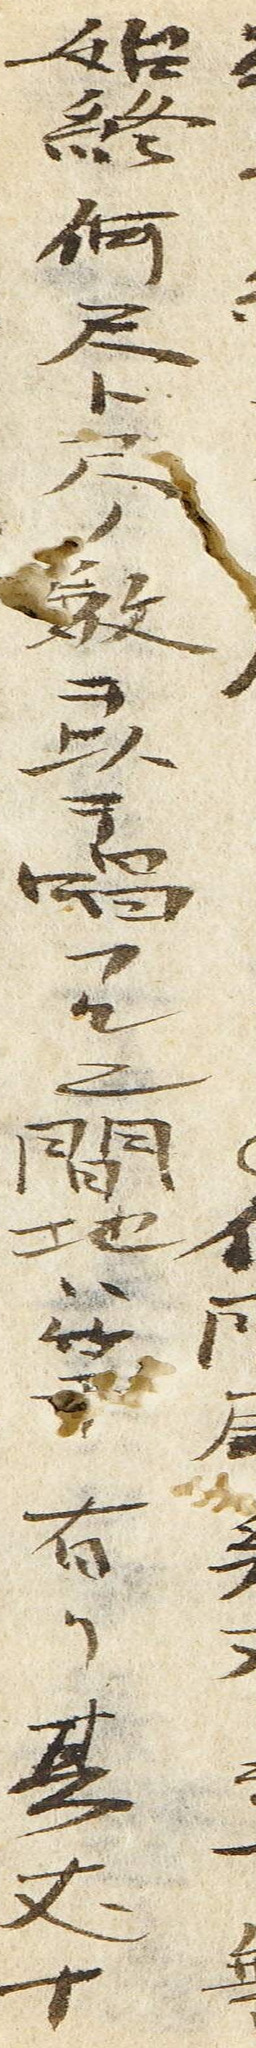始終何尺ト尺ノ数ヲ以テ唱フル也間地ハ有リ其丈十
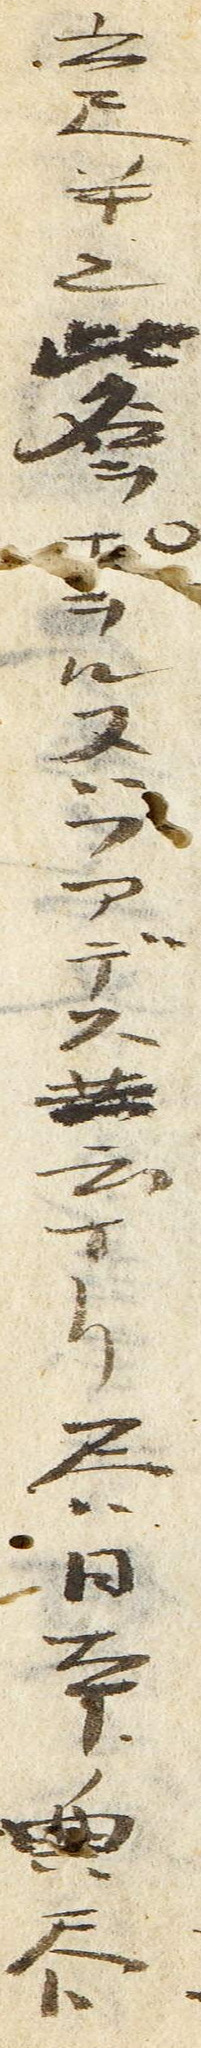六尺半也此名ヲポヲルスハフアデス共云ナリ尺ハ日本ノ曲尺ト

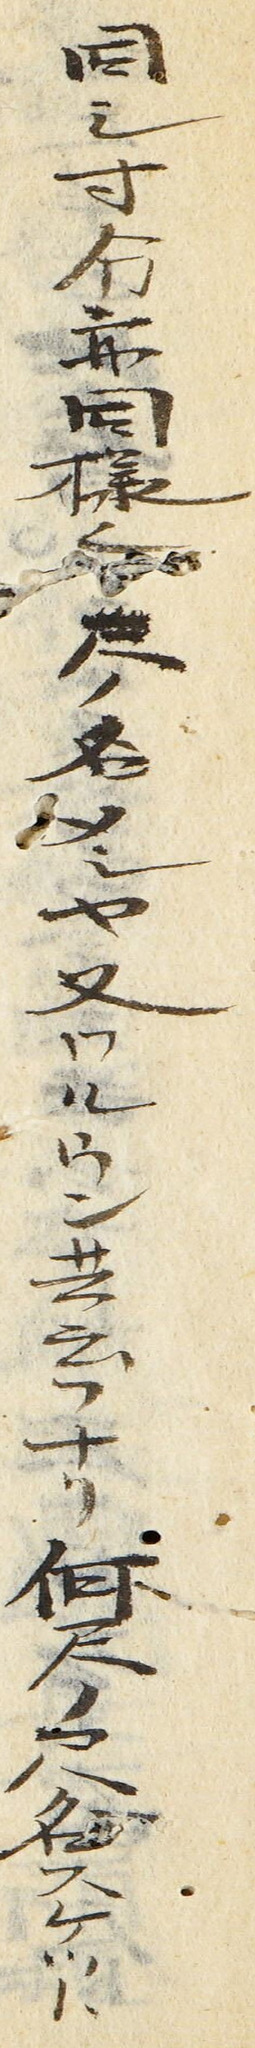同シ寸分亦同様也尺ノ名メシヤ又ルウン共云フナリ何尺ノ尺名スケツト
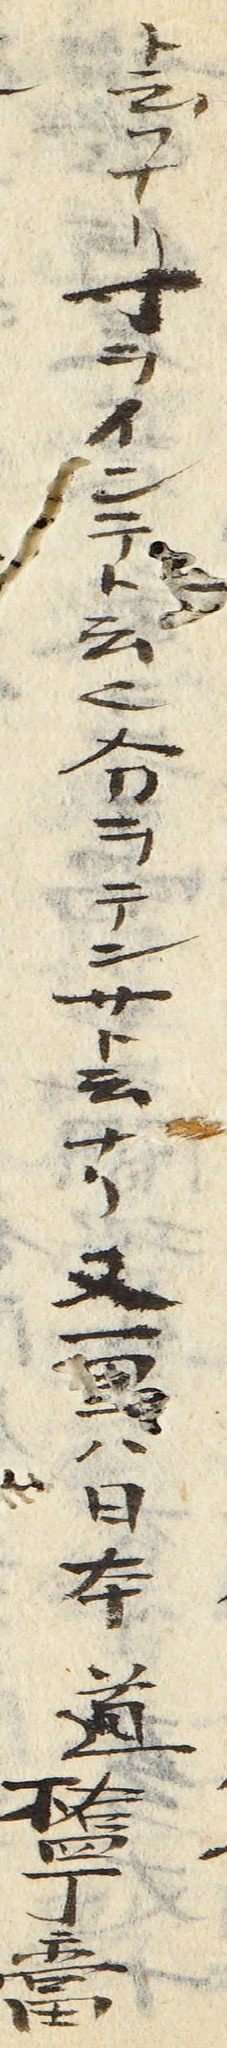ト云フナリ寸ヲインテト云也分ヲテンサト云ナリ又一ハ日本日本道拾四丁ニ当
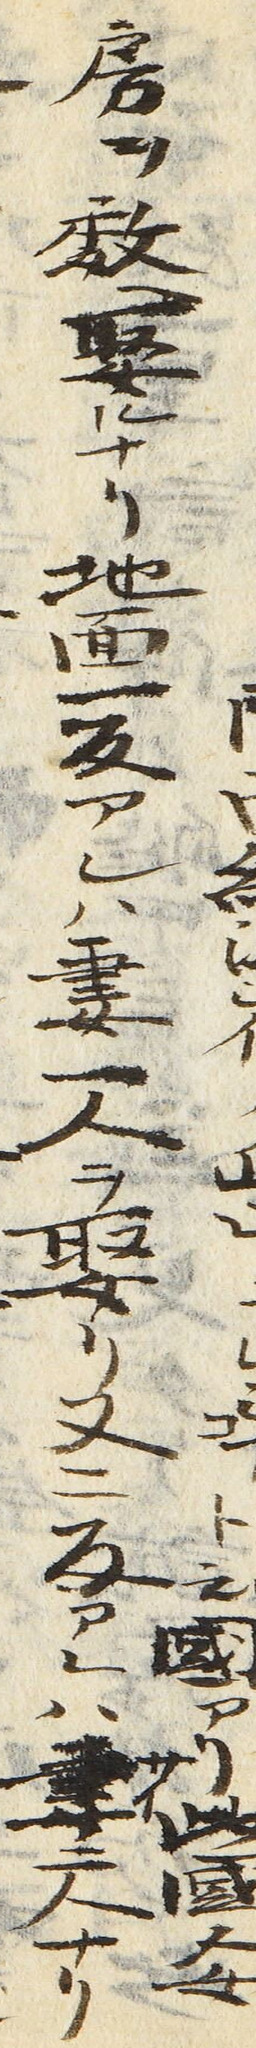房ヲ数ヘ娶ルナリ地面一反アレハ妻一人ヲ娶リ二反アレハ妻二人ナリ
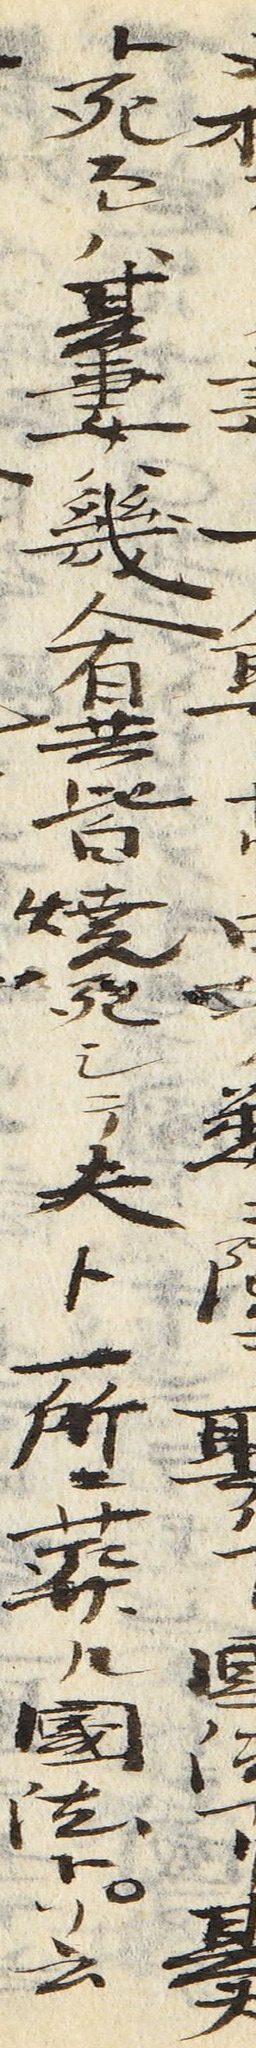又拾反アレハ其妻ハ幾人有共皆焼死シテ夫ト一所ニ葬ル国法トソ云
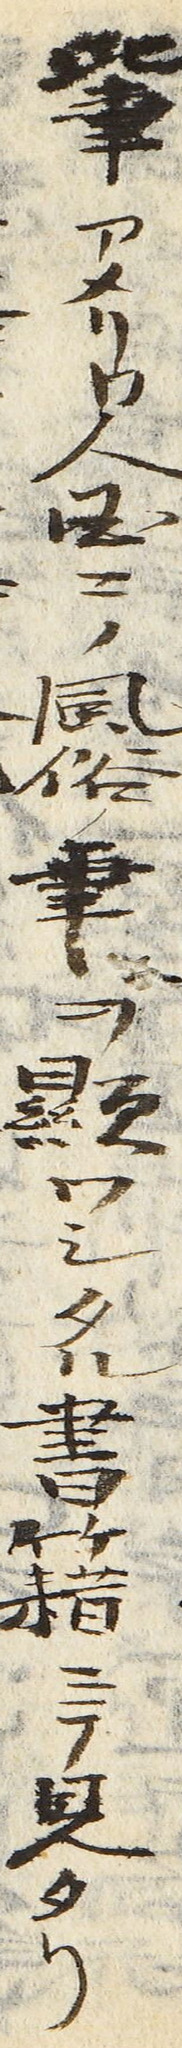此事アメリカ人国ニノ風俗事ヲ顕ワシタル書籍ニテ見タリ
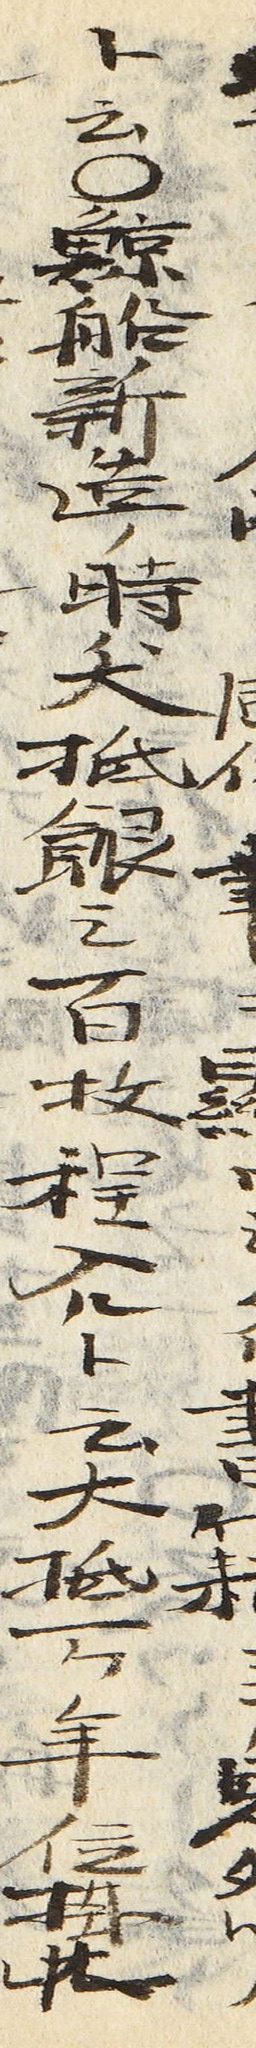ト云〇鯨船新造ノ時ハ大低銀三百枚程入ルト云大抵一ヶ年位掛ル
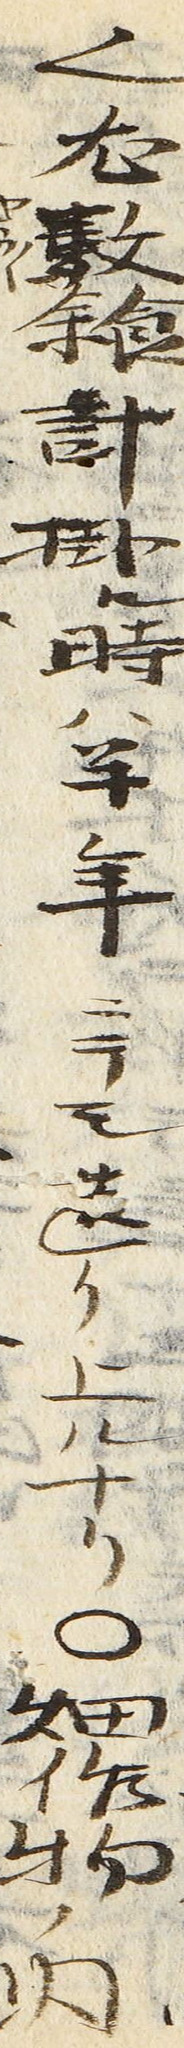也尤敷銀計掛ル時ハ半年ニテモ造リ上ルナリ〇畑作物ノ内
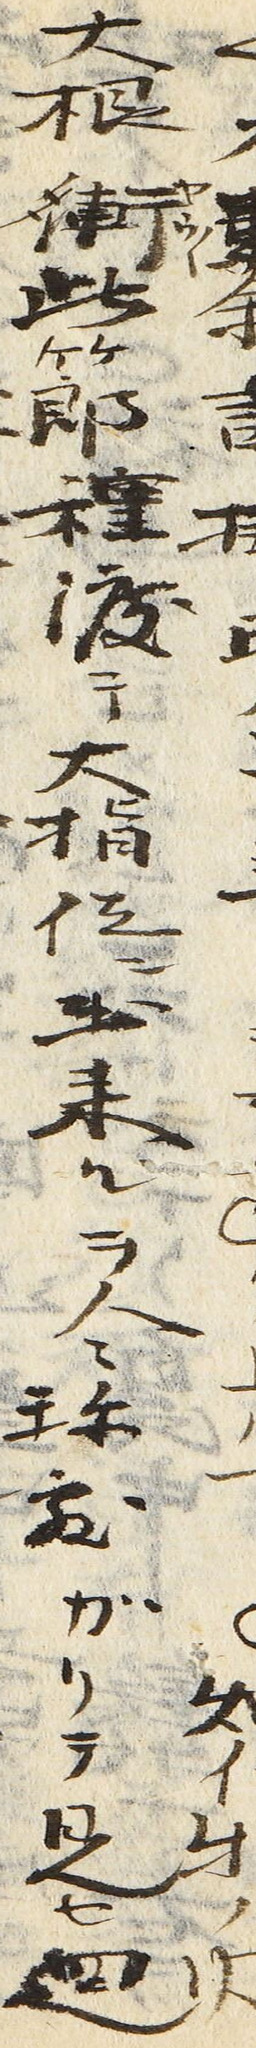大根漸此節種渡テ大指位ニ出来ルヲ人々珍敷ガリテ見
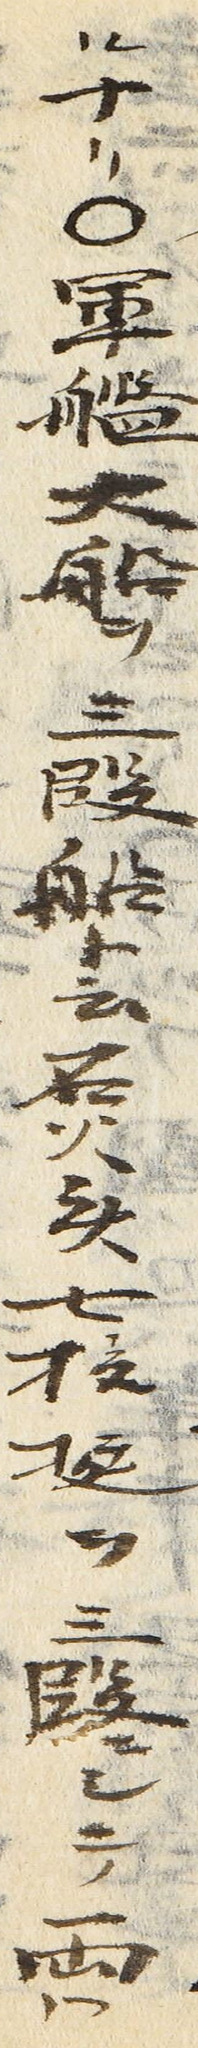ルナリ〇軍艦大船ヲ三段船ト云石火矢七挺ヲ三段ニシテ両ツ
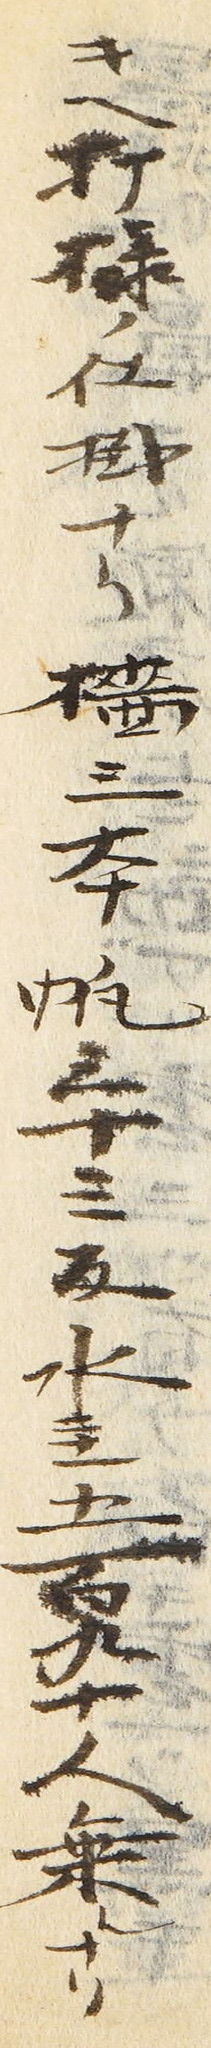キヘ打様ノ仕掛ナリ檣三本帆三十三反水主五百九十人乗ルナリ
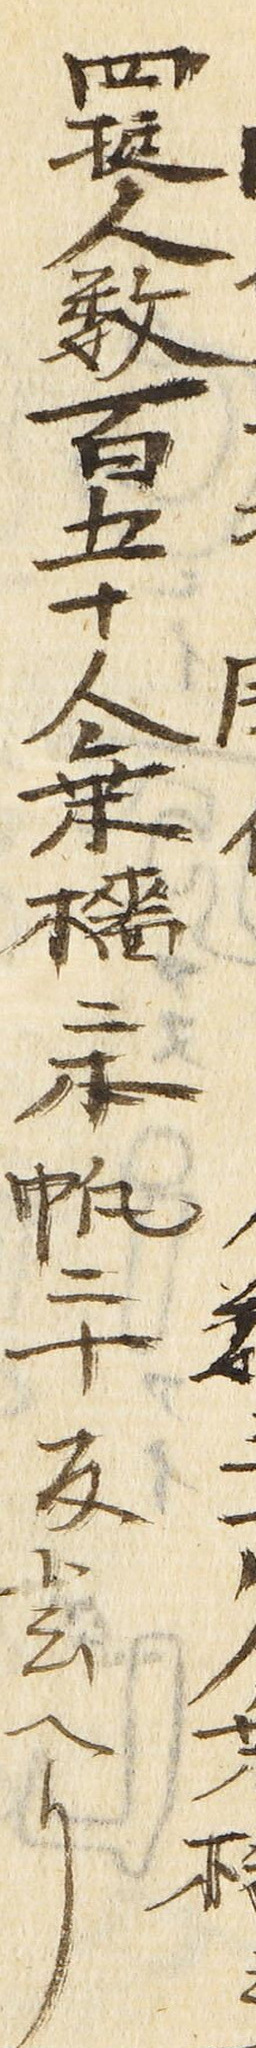四挺人数百五十人乗檣二本帆二十反ト云ヘリ

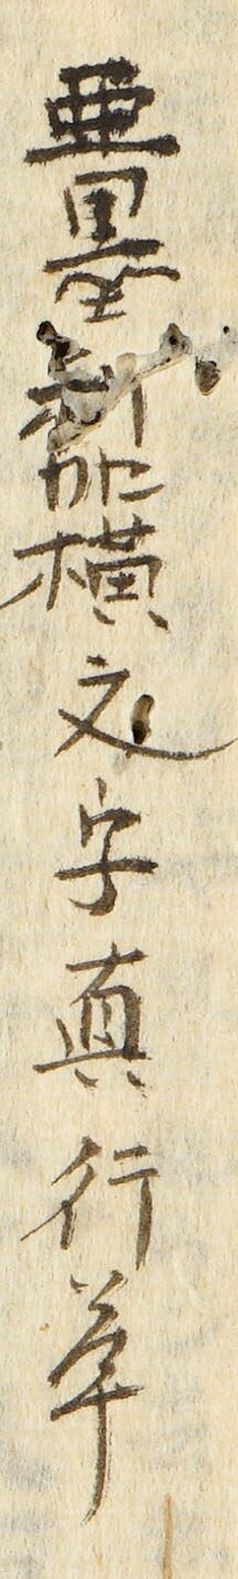亜墨利加横文字真行草

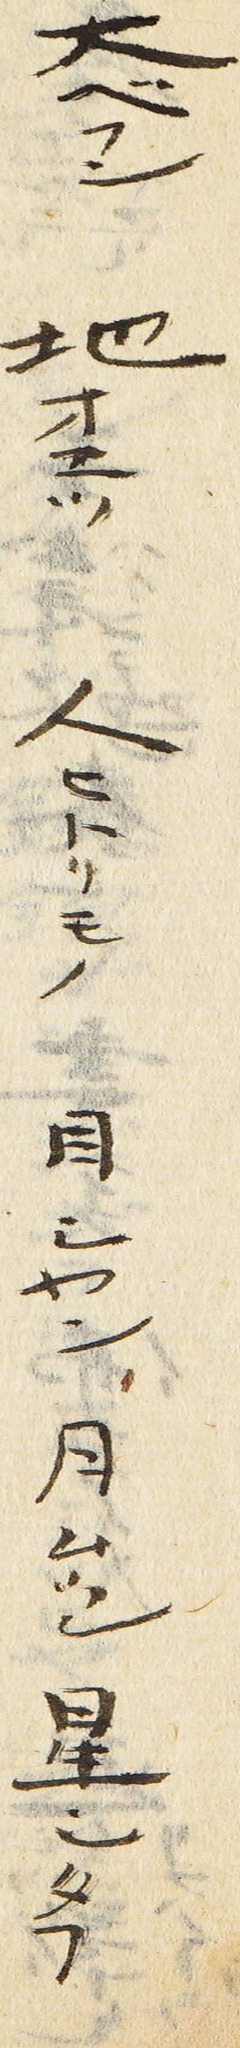天ベフン地オエツ人ヒトリモノ目シヤン月ムウン星シタフ
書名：漂流記聞
